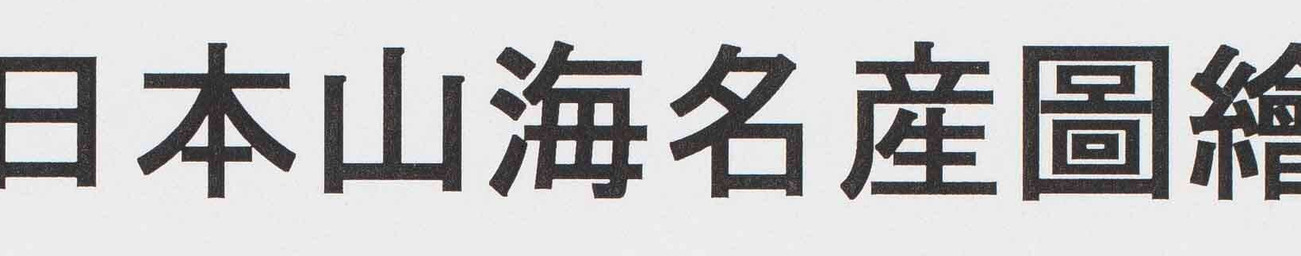日本山海名産図絵

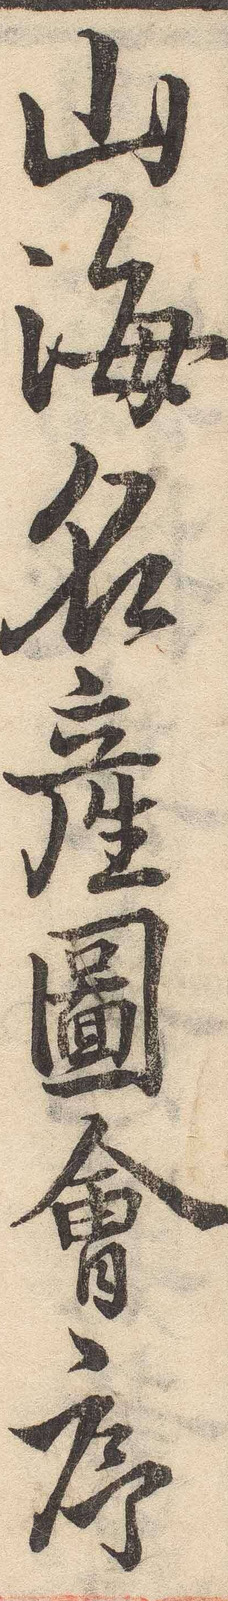山海名産図会序
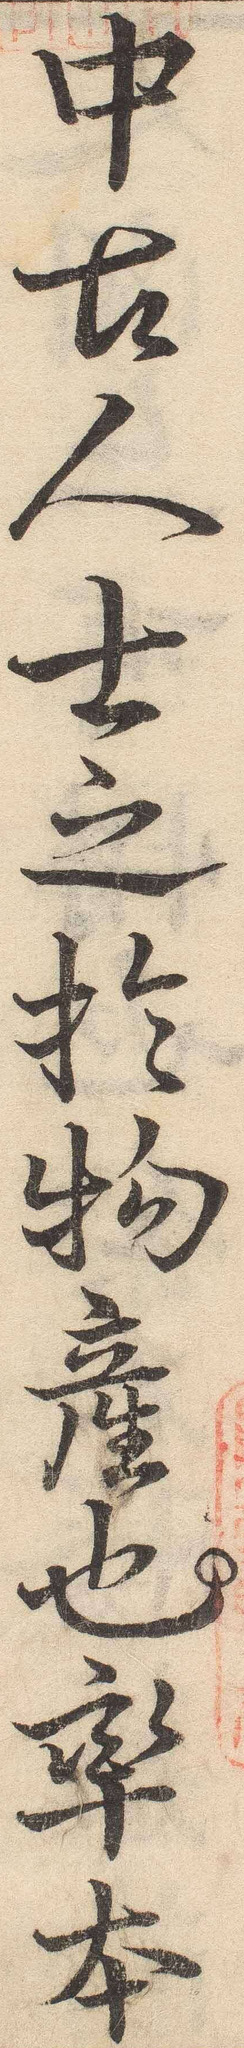中古人士之於物産也率本
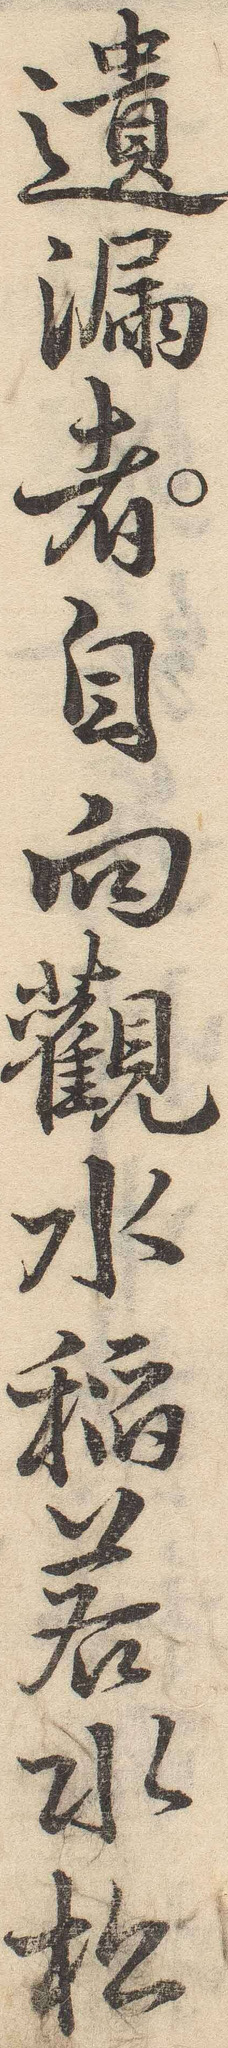遺漏者自向観水稲若水松
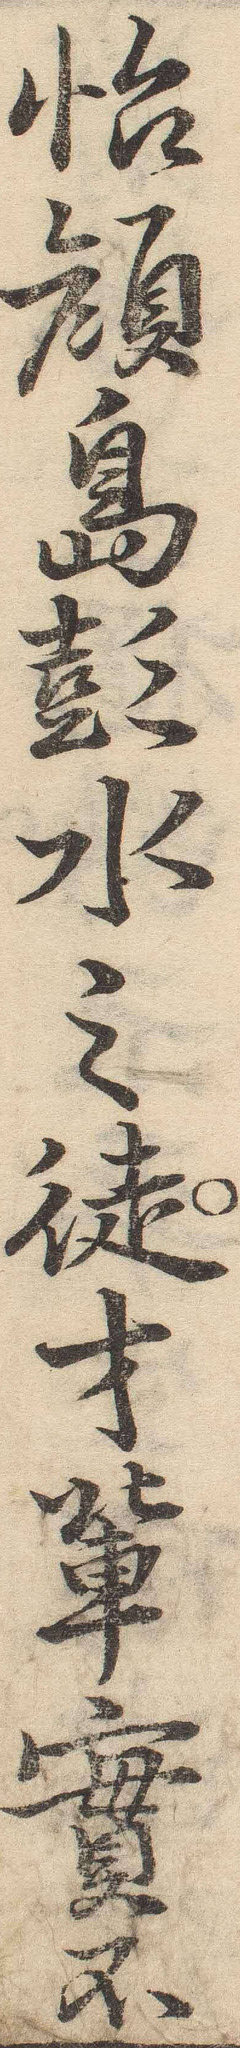怡顔島彭水之徒才輩実不
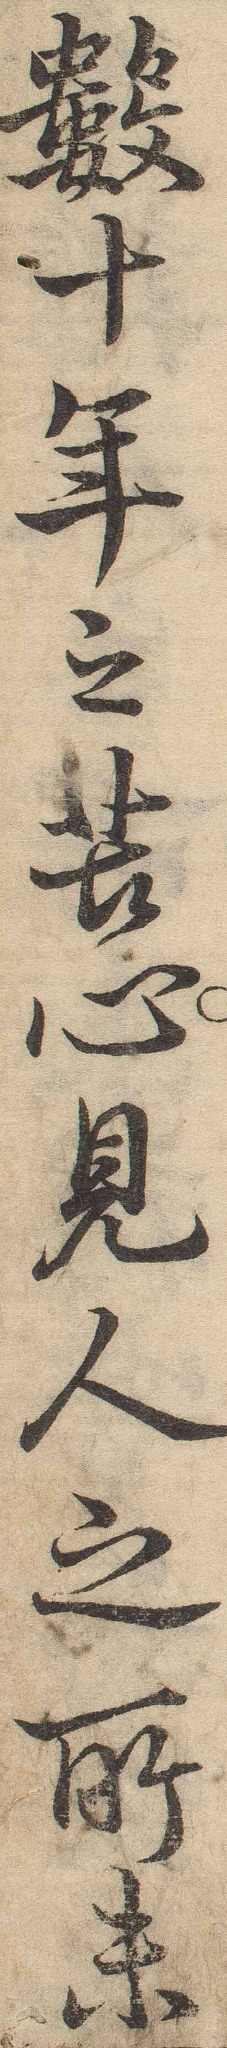数十年之苦心見人之所未

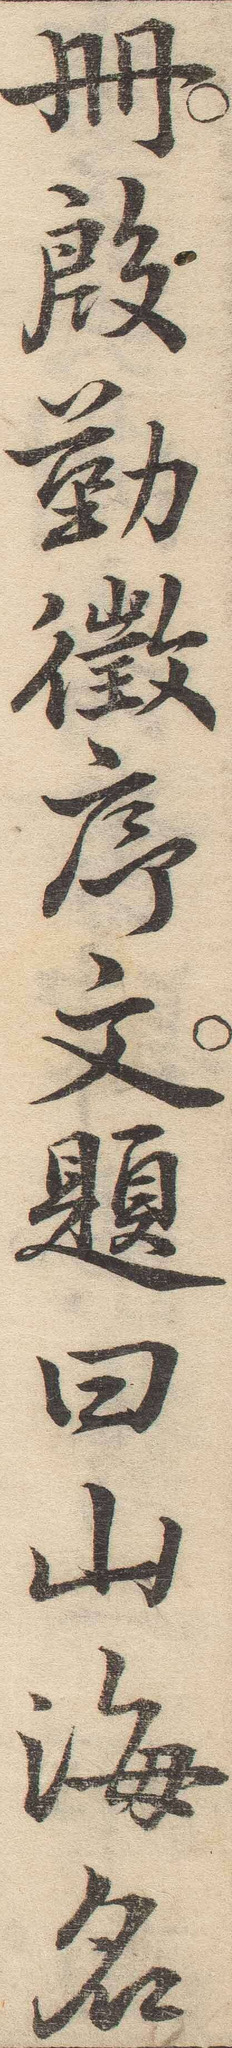冊殷勤徴序文題曰山海名
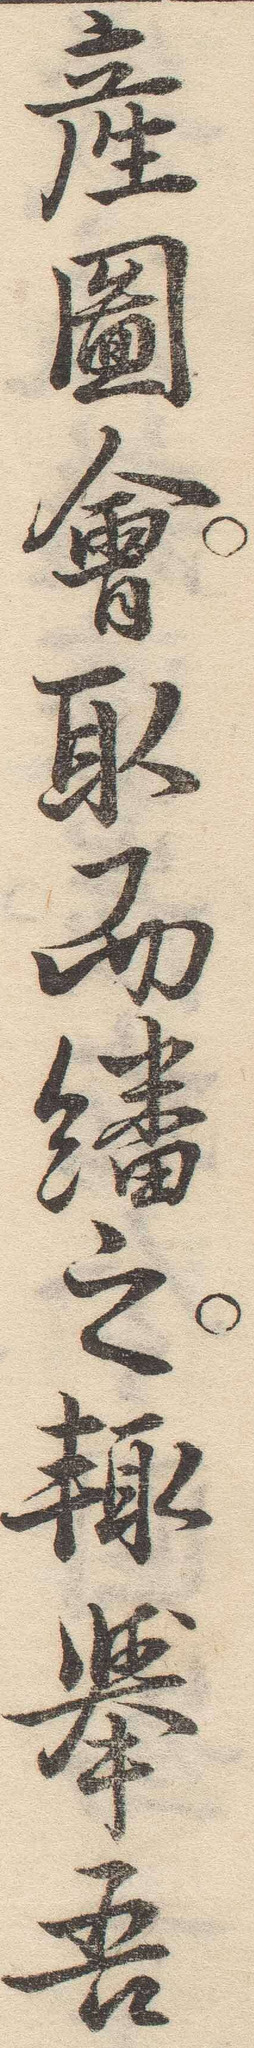産図会取而繙之輒挙吾
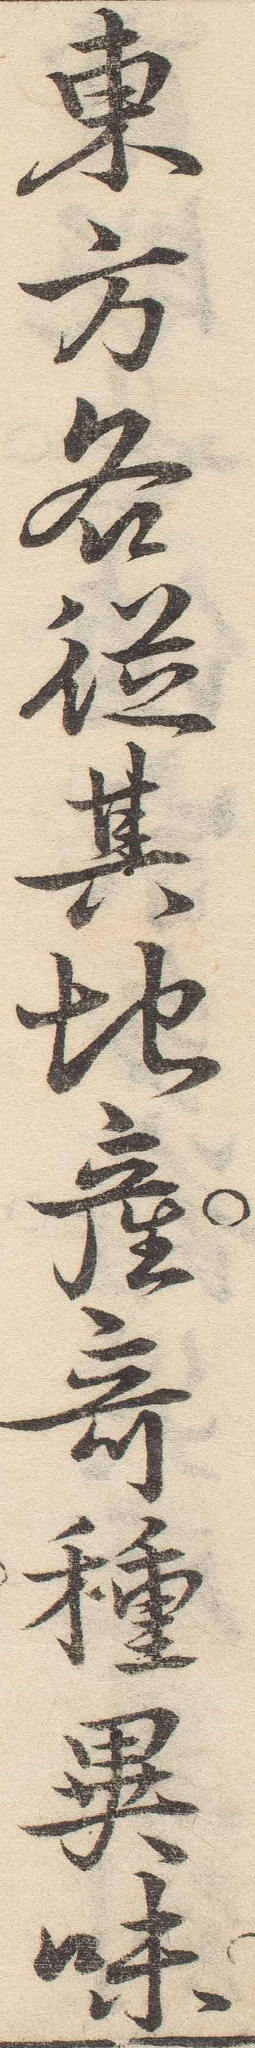東方各従其地産奇種異味
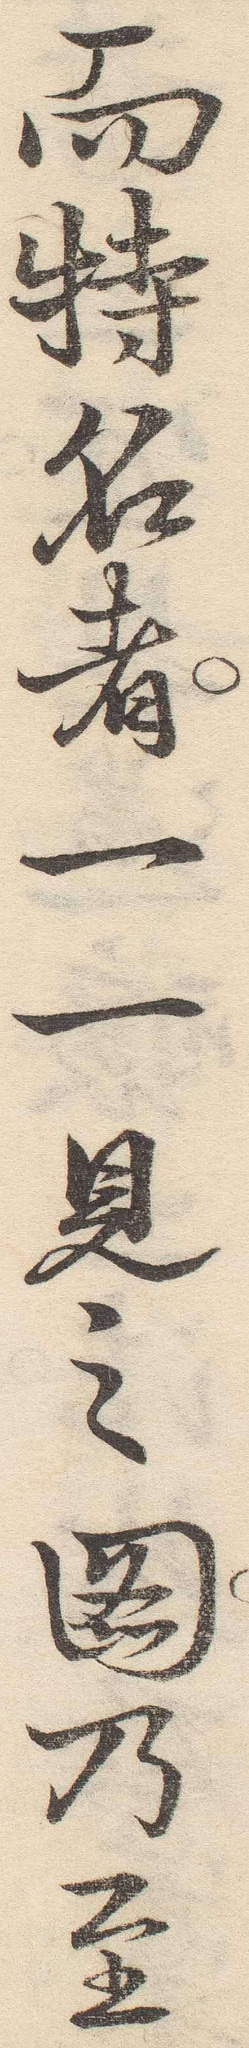而特名者一一見之図乃至
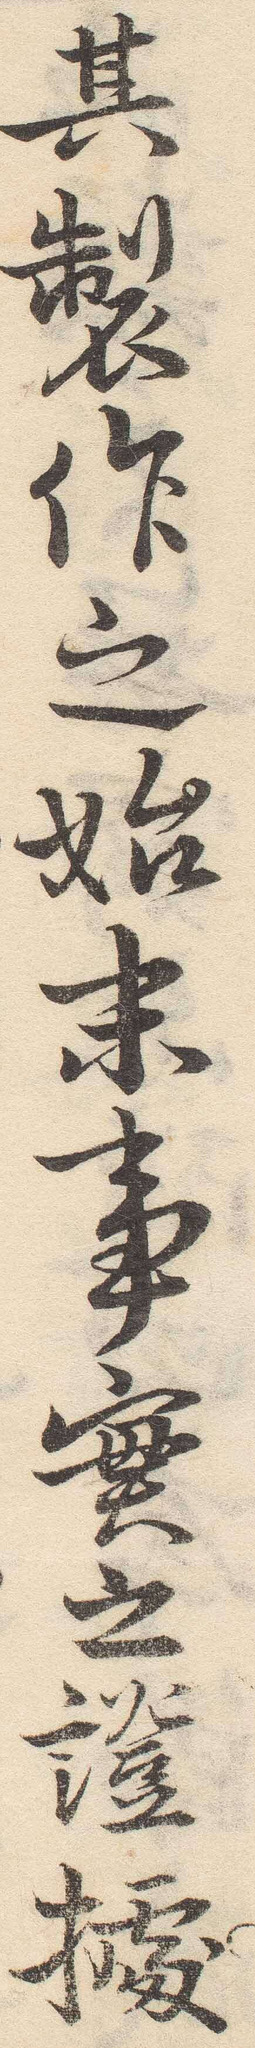其製作之始末事実之証拠
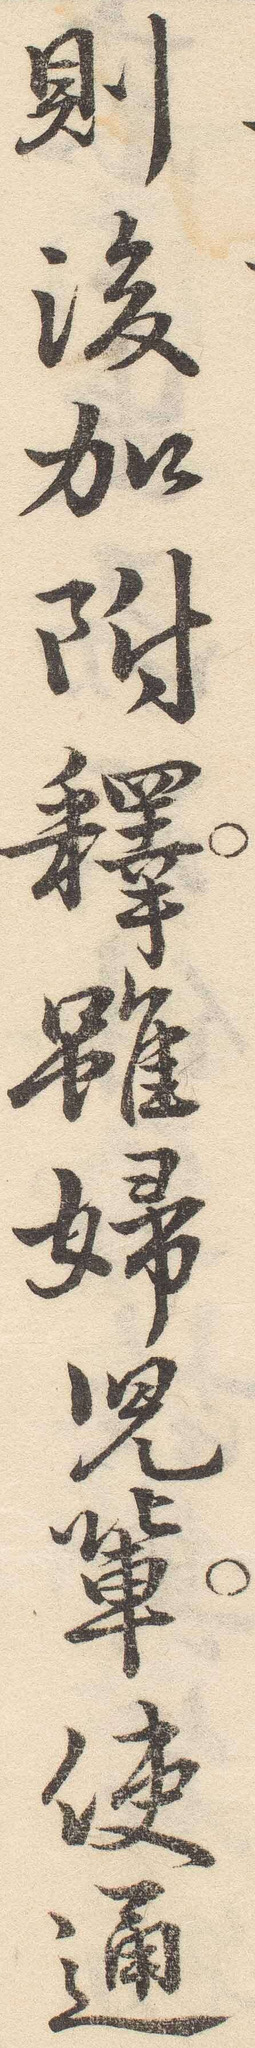則後加附釈雖婦児輩使道
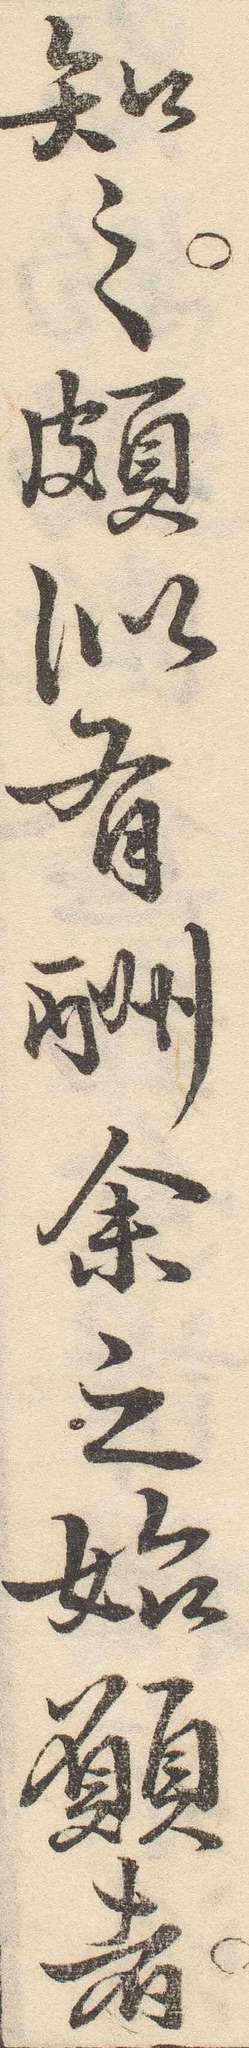知之頗以有酬余之始願者
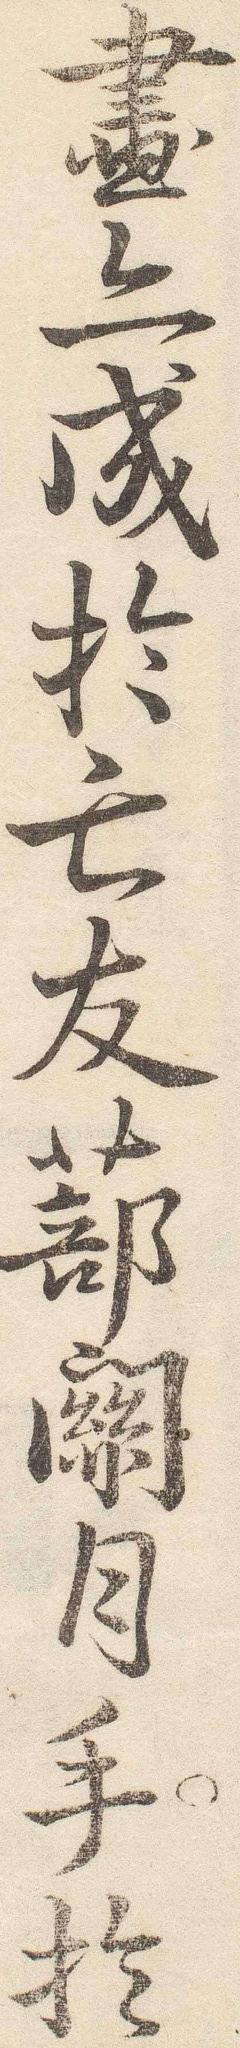尽亦成於亡友蔀関月手於
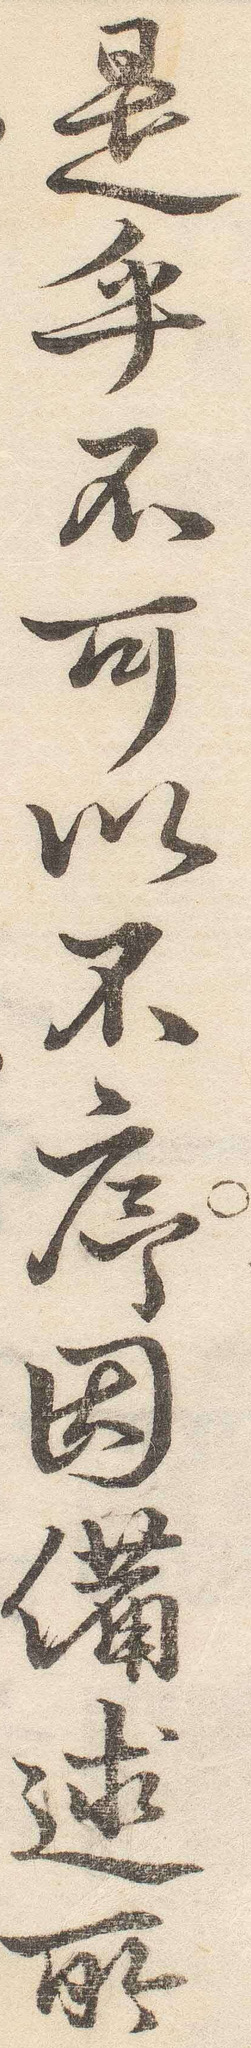是乎不可以不序因備述所
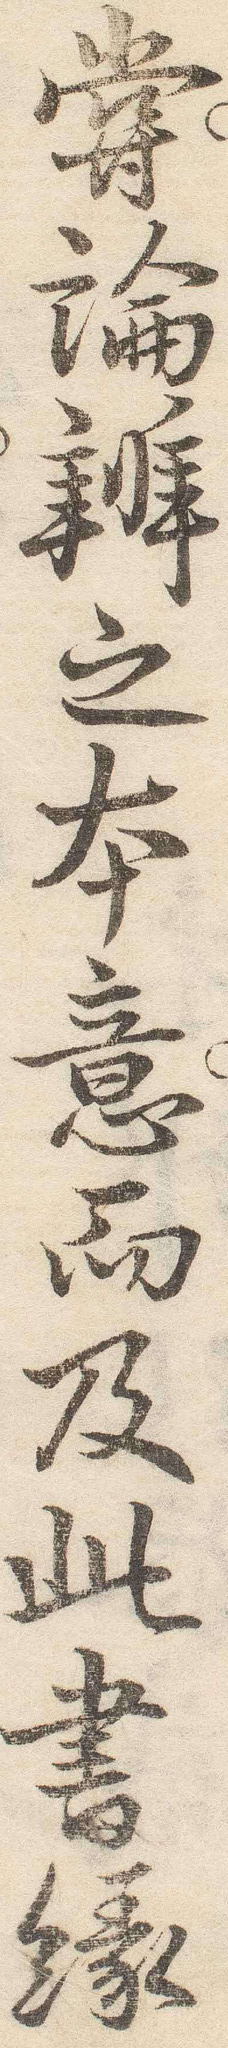甞論弁之本意而及此書縁
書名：日本山海名産図会
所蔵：東京学芸大学附属図書館 国文学研究資料館
